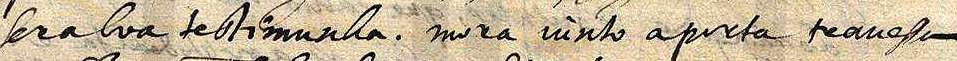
sera boa testimunha. mora iunto a porta trauessa
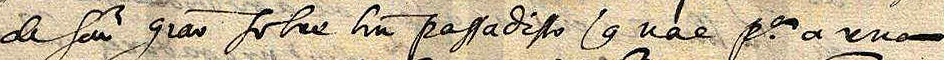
de saõ giaõ sobre hū passadisso q̄ uae p.a a rua
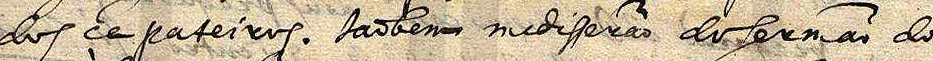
dos çapateiros. taõbem me disserão do sermão do
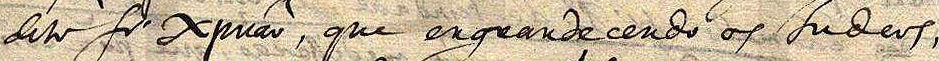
dito fr. Xpuaõ, que engrandecendo os Iudeos,
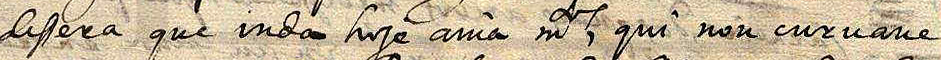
dissera que inda hoje auia mtos, qui non curuaue
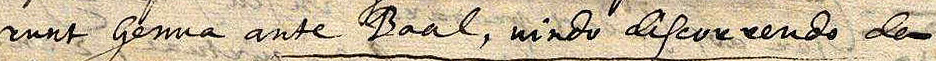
runt genua ante Baal, uindo discurrendo da
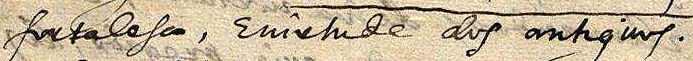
fortalesa, E uirtude dos antiguos.
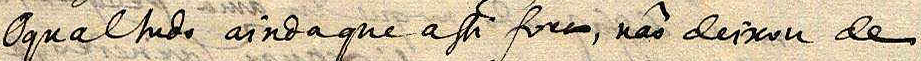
O qual tudo ainda que assi fora, naõ deixou de
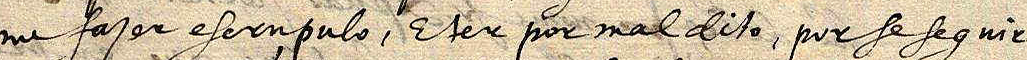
me fazer escrupulo, E ter por mal dito, por se seguir
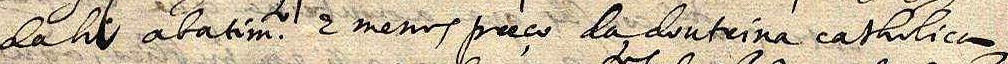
dahi abatimto. E menospreço da doutrina catholica
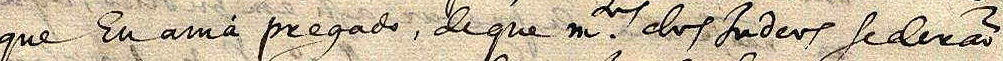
que Eu auia pregado, de que mtos. dos Judeos se deraõ
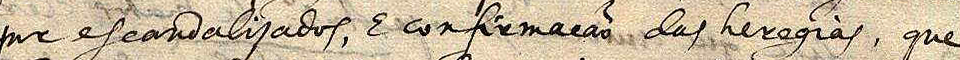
por escandalizados, E confirmacaõ das heregias, que
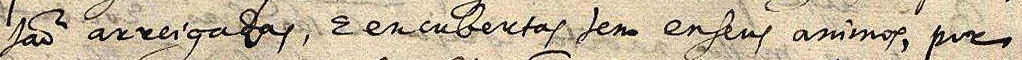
taõ arreigadas, E encubertas tem em seus animos, por
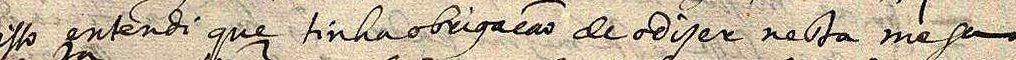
isso entendi que tinha obrigacão de dizer nesta mesa
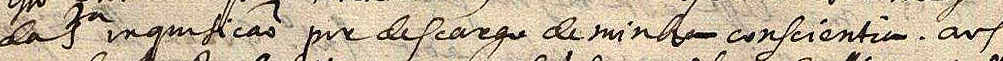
da sta inquisicão por descargo de minha conscientia. aos
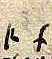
R f
